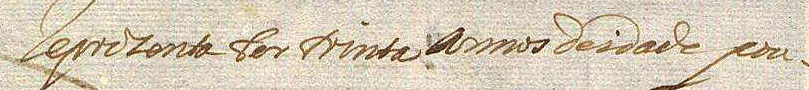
Reprezenta ter trinta annos de idade pou
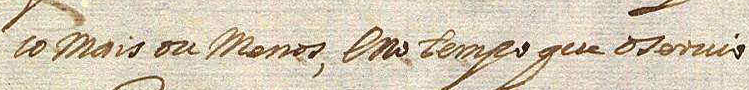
co mais ou menos, e no tempo que o seruio
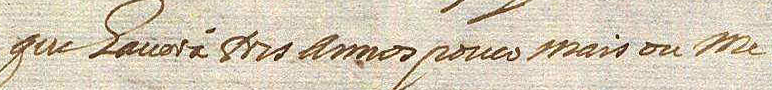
que hauerá tres annos pouco mais ou me
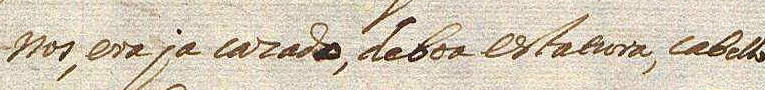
nos, era ja cazado, de boa estatura, cabello
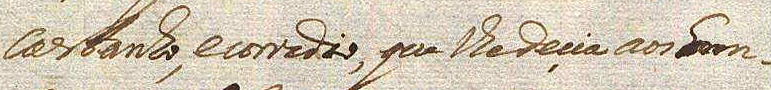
castanho, e corredio, que lhe deçia aos hom
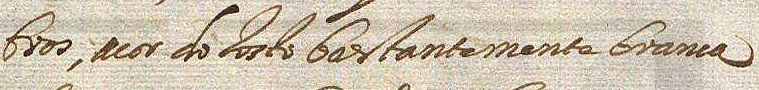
bros, a cor do Rosto bastantemente branca
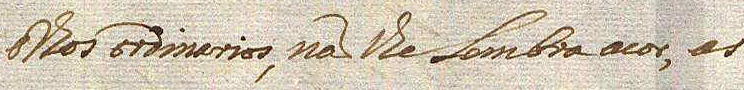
olhos ordinarios, naõ lhe Lembra a cor, as
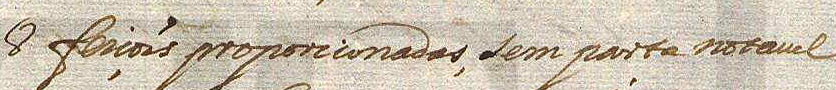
feiçoēs proporcionadas, sem parte notauel
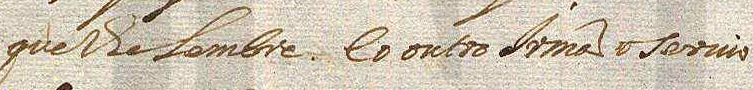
que lhe Lembre. E o outro Irmaõ o seruio
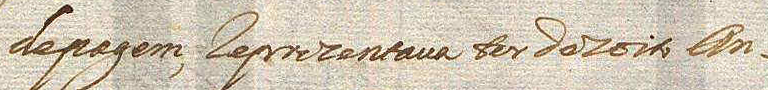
de pagem, Reprezentaua ter dezoito an
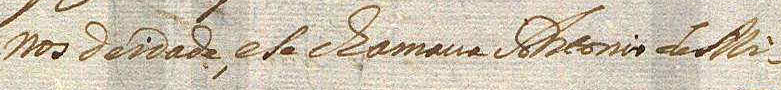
nos de idade, e se chamaua Antonio de Mi
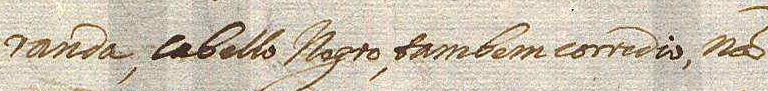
randa, cabello Negro, tambem corredio, naõ
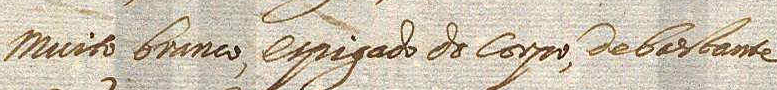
muito branco, espigado do corpo, de bastante
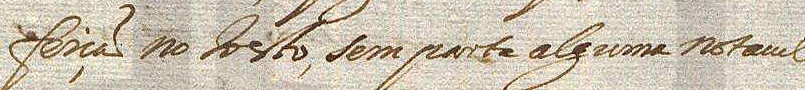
feiçaõ no Rosto, sem parte alguma notauel
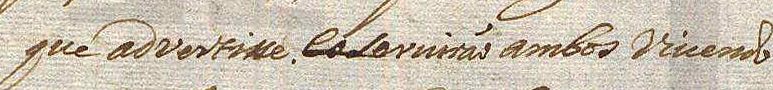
que advertisse. e o seruiraõ ambos viuendo
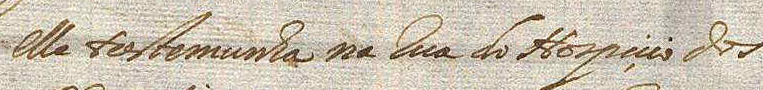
elle testemunha na Rua do Hospiçio dos
